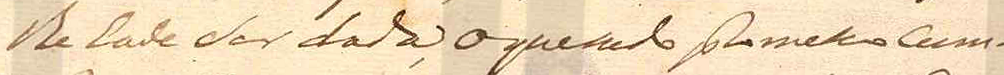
lhe ha de ser dada, o que tudo prometeo cum
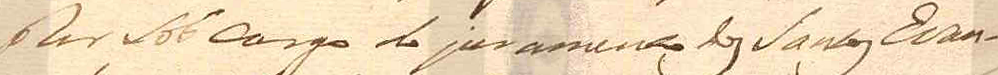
prir sob cargo do juramento dos Santos Evan
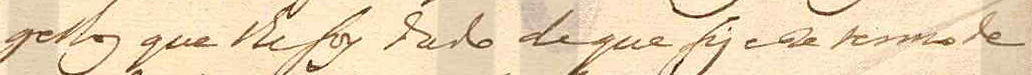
gelhos que lhe foy dado de que fis este termo de
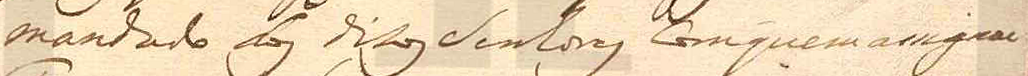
mandado dos ditos Senhores Com quem assignou
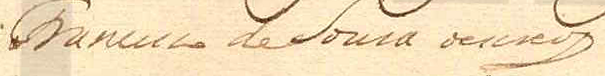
Francisco de Souza o escrevj
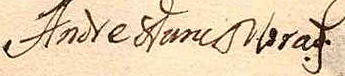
Andre Nunes Moraõ.
